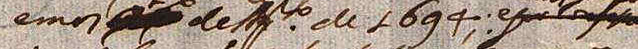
em os 18 de Ag.o de 1694; e por confessar
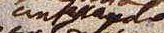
confessando
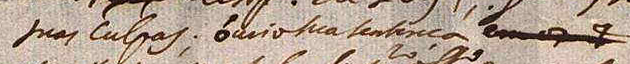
suas culpas, ouuio sua sentença em os 4
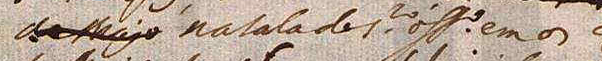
de Majo na sala do s.to off.o em os 4
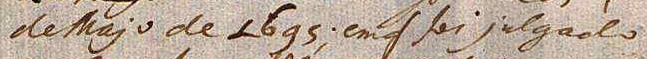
de Majo de 1695; em q̄ foi julgado
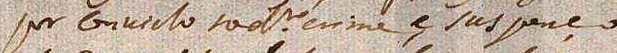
por conuicto no d.o crime e suspenço
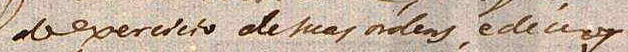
do exercicio de suas ordens, e de uos
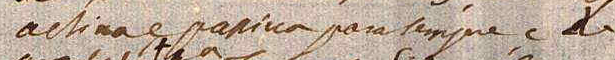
actiua e passiua para sempre e de
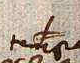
tempo
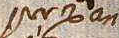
por 8 an
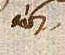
nos.
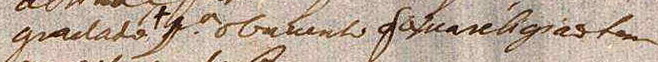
gradado + p.a o conuento q̄ a sua religiaõ tem
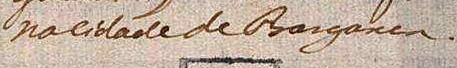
na cidade de Bragança.
